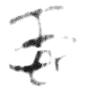○（恐）
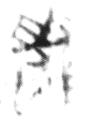懼
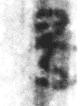是
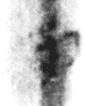爲
